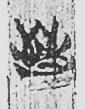晉
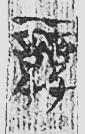競
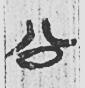公
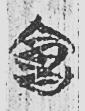會
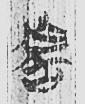者
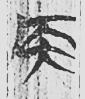侯
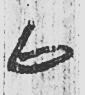㠯（以）
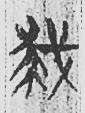{求戈}
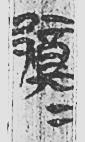鄭=
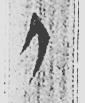人
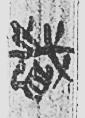{止頁戈}
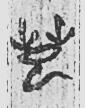芸
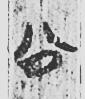公
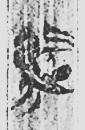義
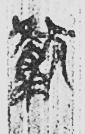獻
